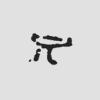亓（其）
